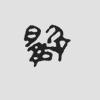{脟隹}
